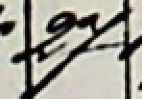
27
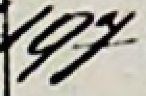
197
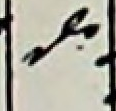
do
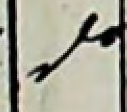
do
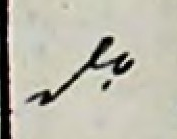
do
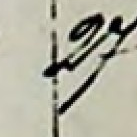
27
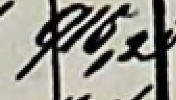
915,2
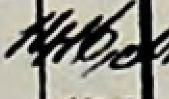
1446,0
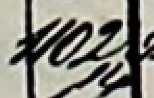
1102,4
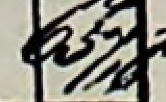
657,6
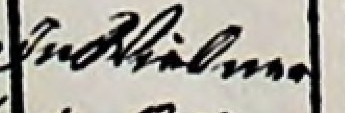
In Wiesner
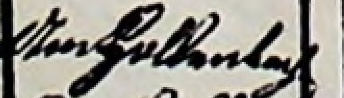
Am Hollenbach
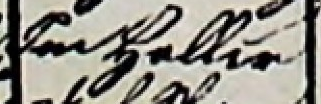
Im Holler
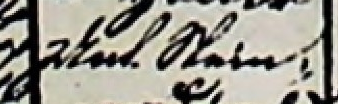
Unt. Stein„
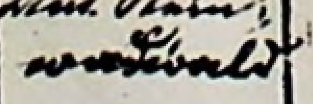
wadwald
